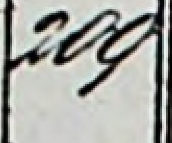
209
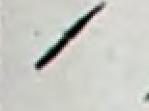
1
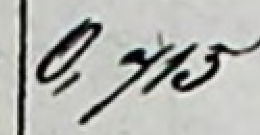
0,715
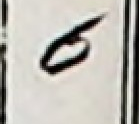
6
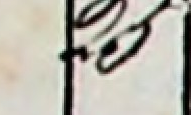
25
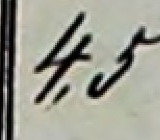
4,5
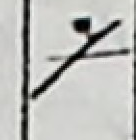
7
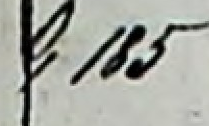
0,185
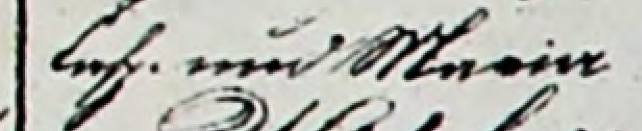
Consp. und Maria
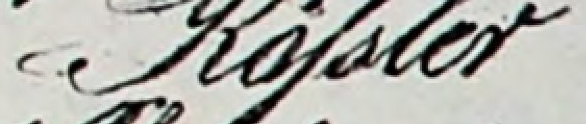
Kössler
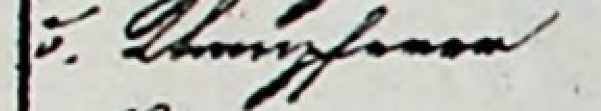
v. Klangferer
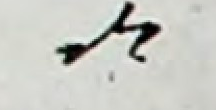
do
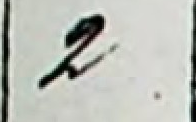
2
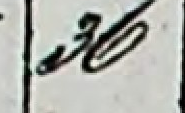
36
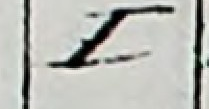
I
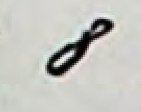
8
